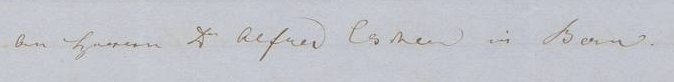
An Herrn Dr Alfred Escher in Bern.
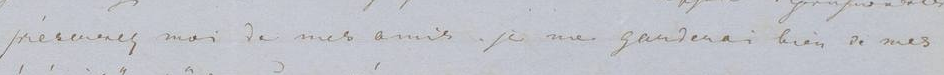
«préservez moi de mes amis – je me garderai bien de mes
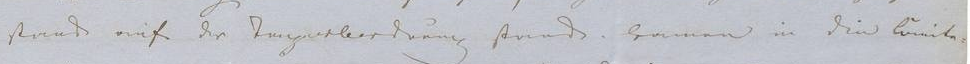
stand auf der TagesOrdnung stand – kamen in die Comite-
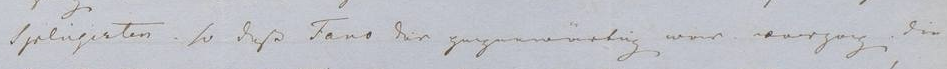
Splügisten – so daß Fano der gegenwärtig war vorzog – die
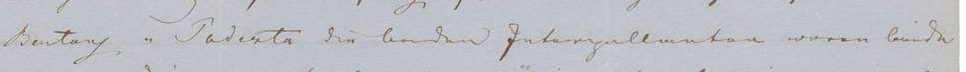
Bertanj u Podesta die beiden Interpellanten waren beide
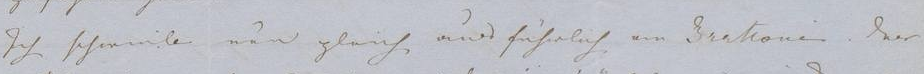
Ich schrieb nun gleich ausführlich an Grattoni – der
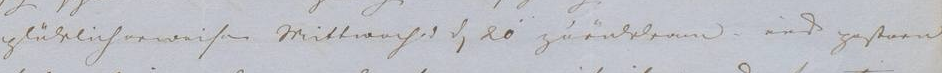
glüklicherweise Mittwochs den 20t zurükkam – und gestern
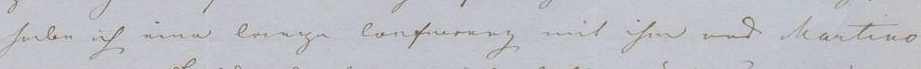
habe ich eine lange Conferenz mit ihm und Martino
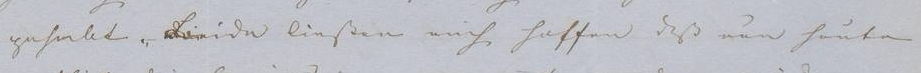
gehabt. Beide ließen mich hoffen daß nun heute
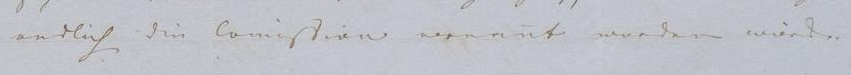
endlich die Comission ernannt werden würde. –
